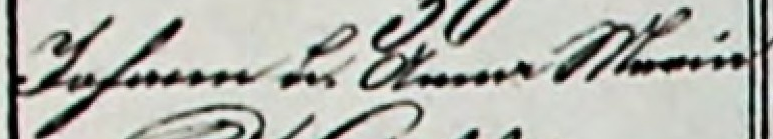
Johann u. Anna Maria
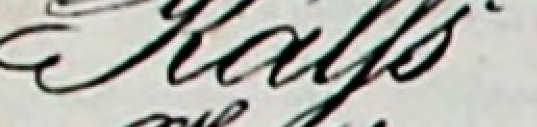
Kalss
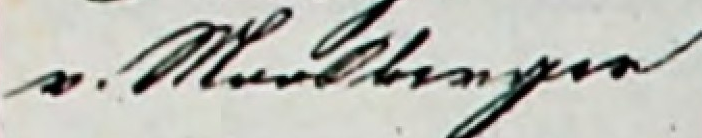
v. Marsberger
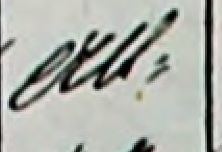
Alt„
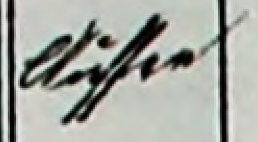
Aussee
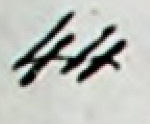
44
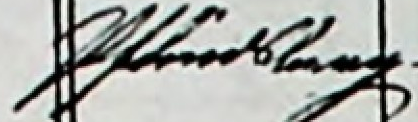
Pflindsberg
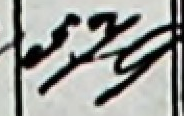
579
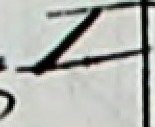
I
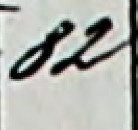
82
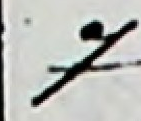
7
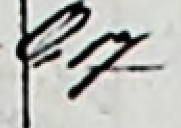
0,17
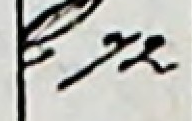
0,72
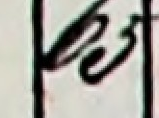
65
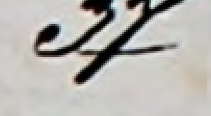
37
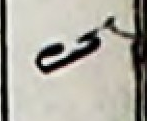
5
